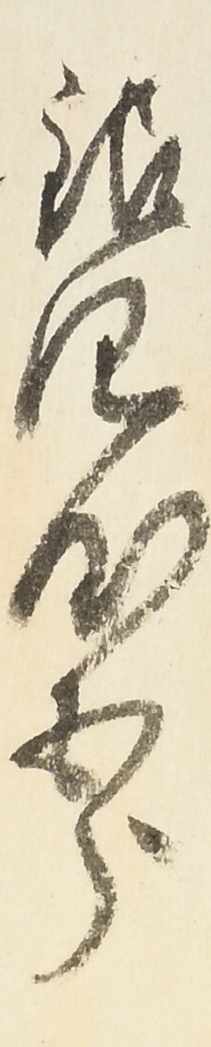銀四匁五分
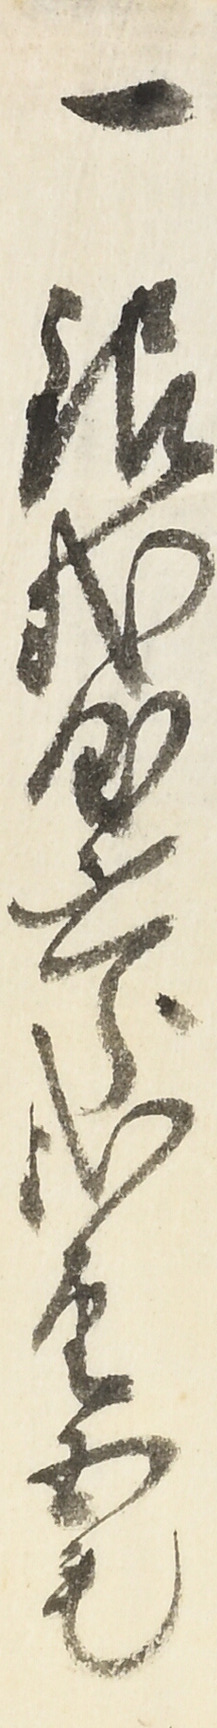一銀弐匁六分弐厘五毛
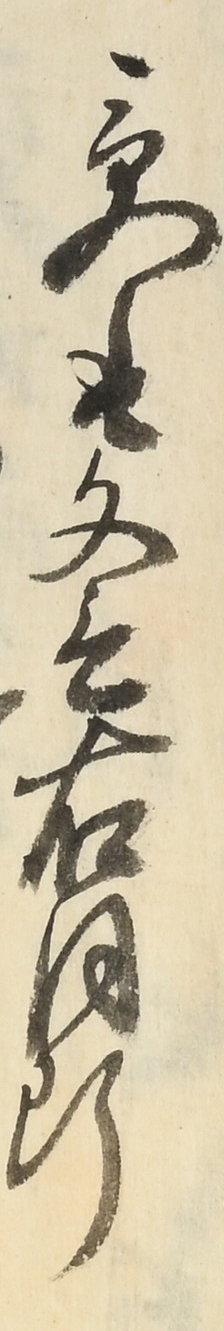請取文言右同断
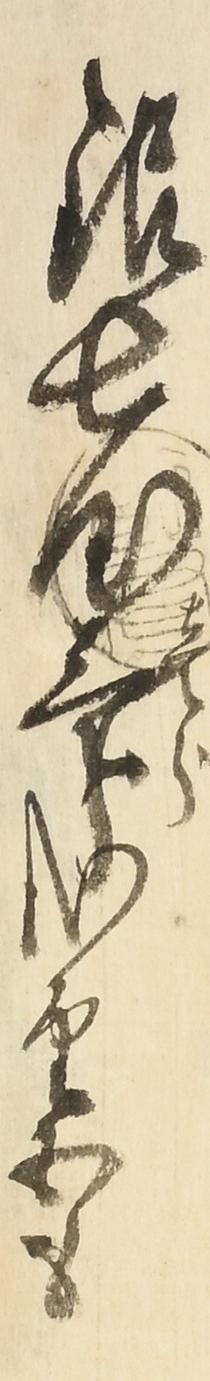一銀弐匁六分弐厘五毛

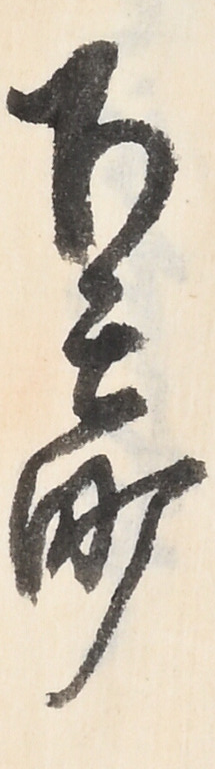下モ町
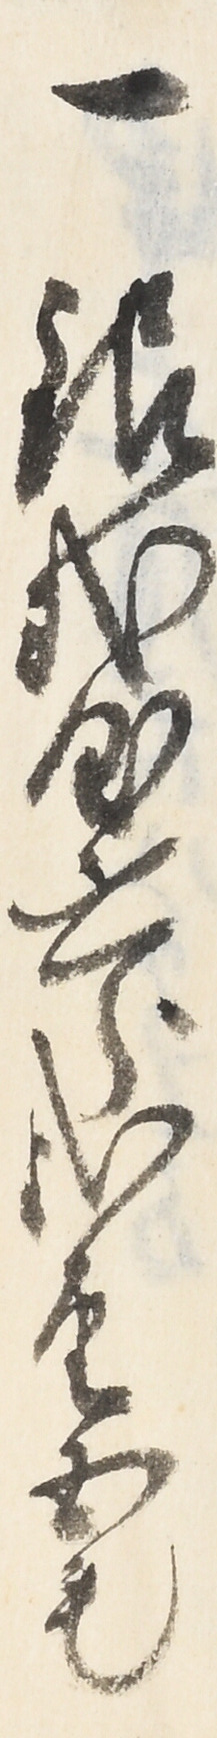一銀弐匁五分弐厘五毛
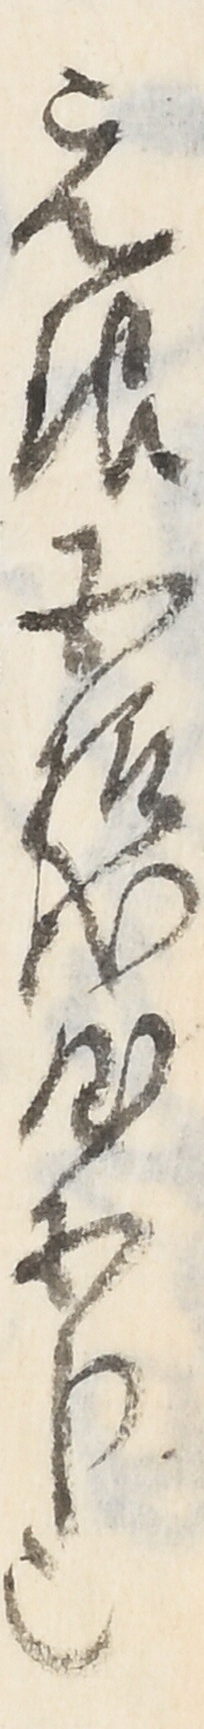元銀五拾匁五分也
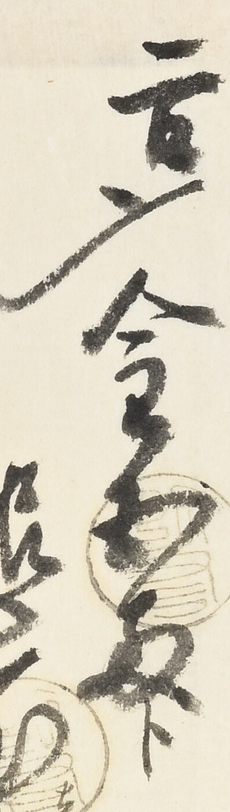二口〆金五両ト
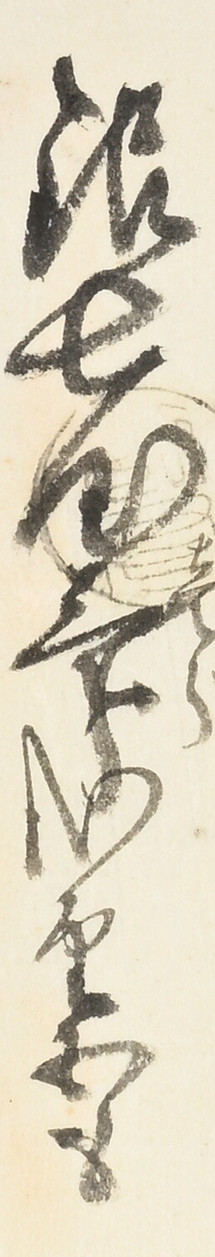銀七匁壱分弐厘五毛
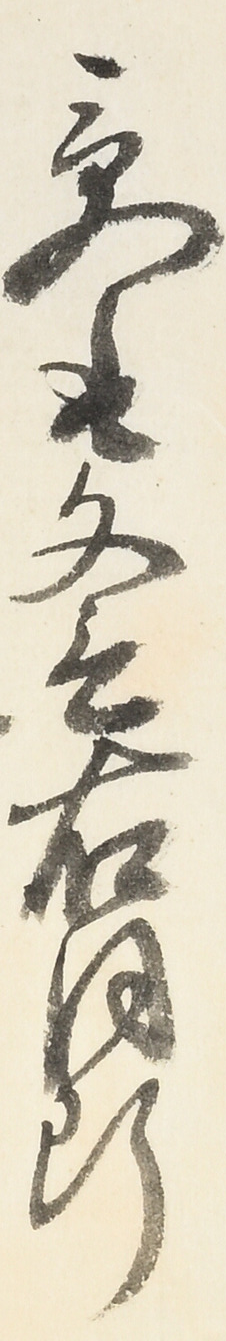受取文言右同断
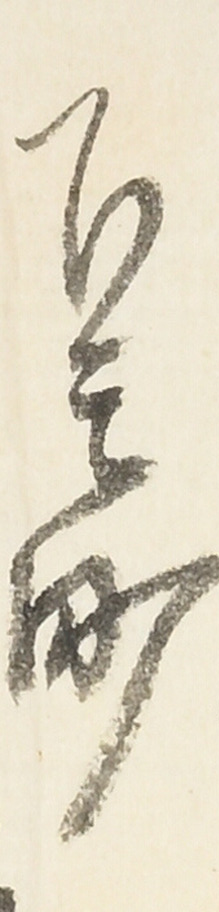下モ町
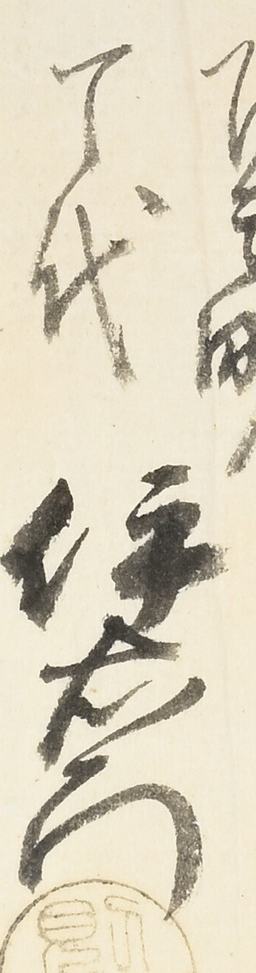酉丁代伊右衛門
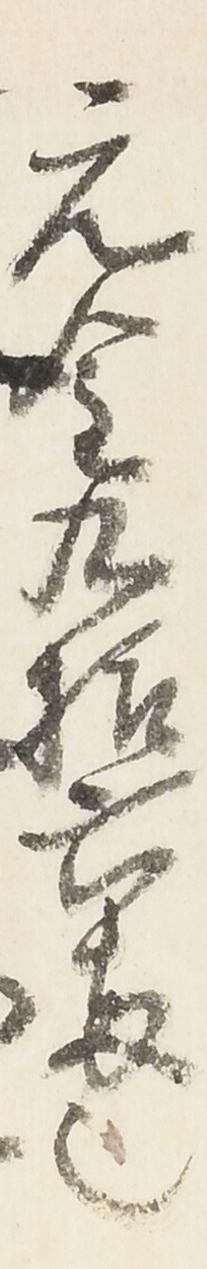元金九拾六両也
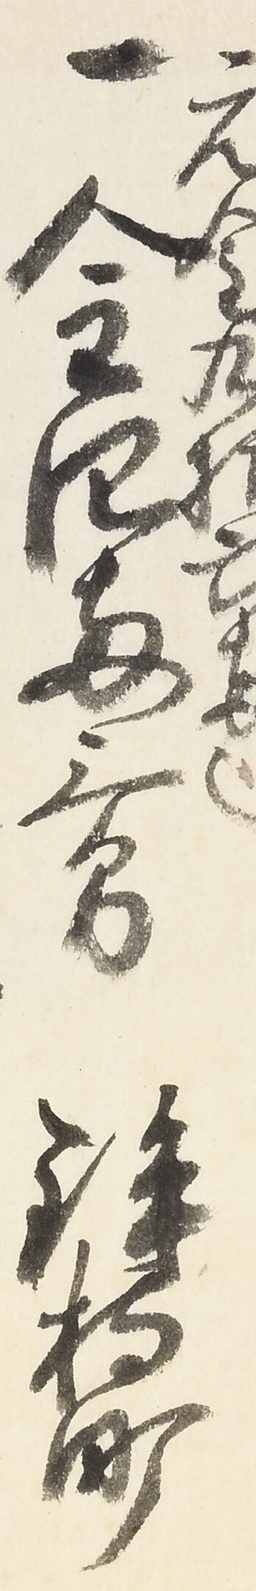一金四両三分鉾持町
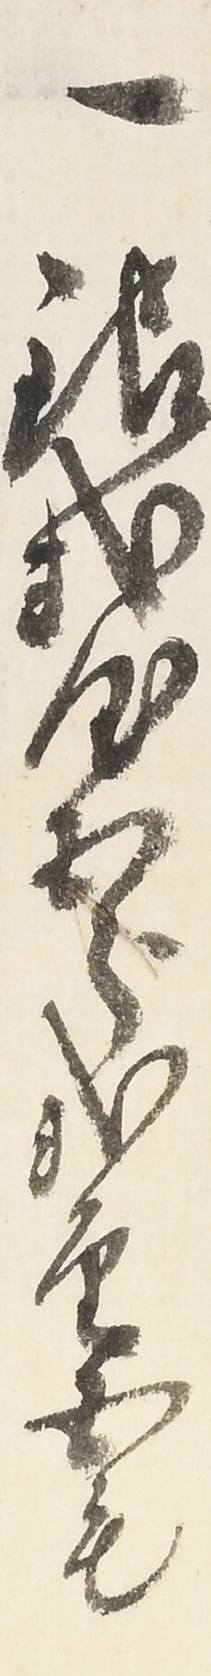一銀弐匁五分弐厘五毛
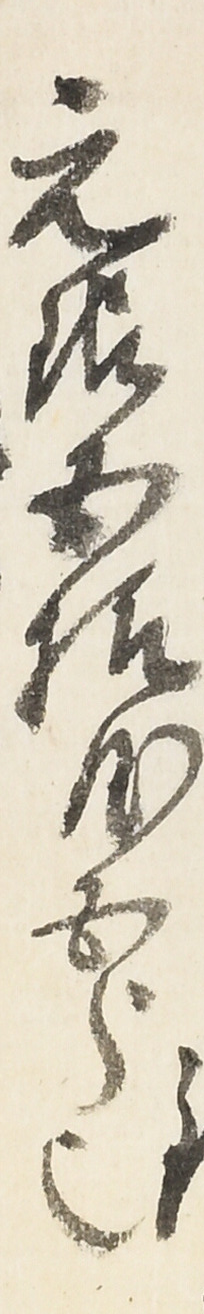元銀五拾匁五分也
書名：御才覚金御利足割渡扣帳
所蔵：伊那市立高遠町図書館・合同会社AMANE
